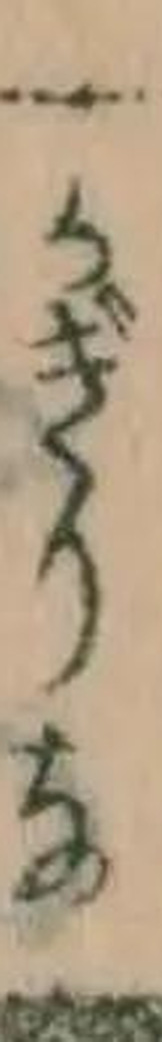かぎりな
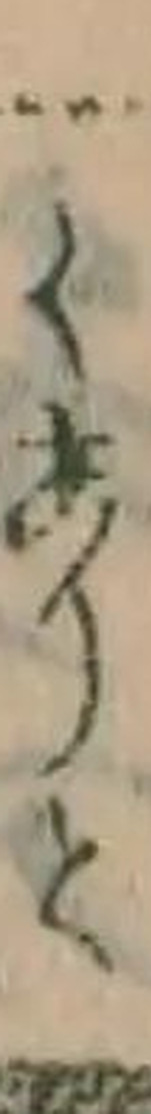くありと
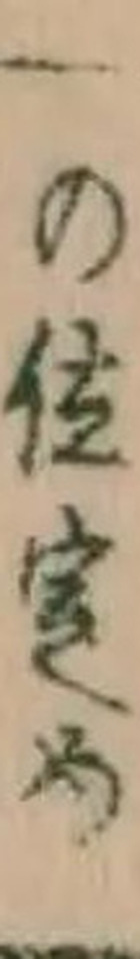の位定め
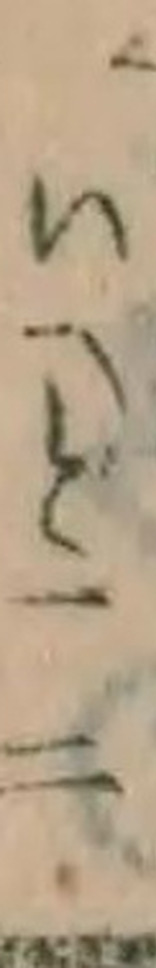うへと一二
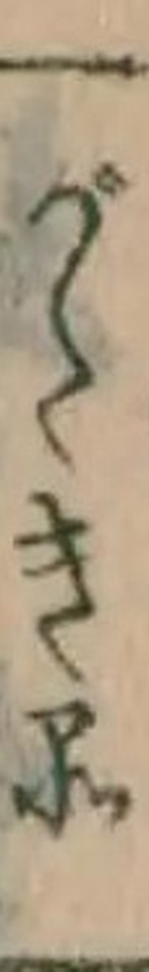がたき品
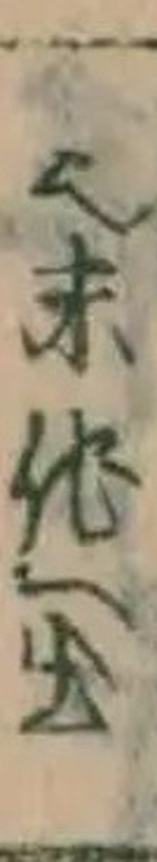也未他へ出
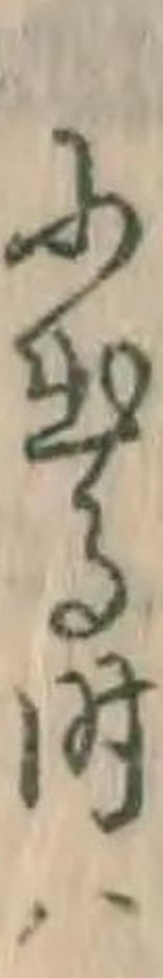ふ出る時は
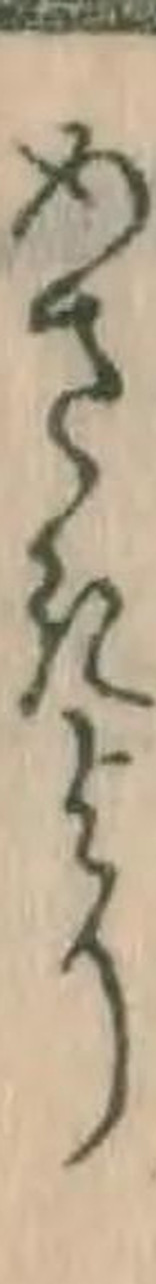めさきより
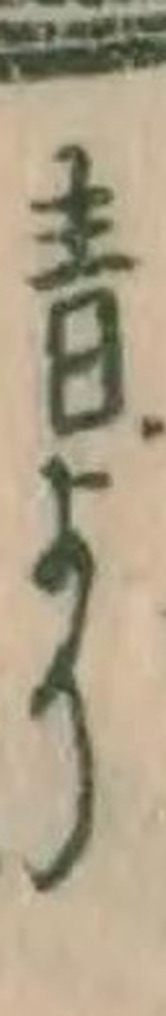青より

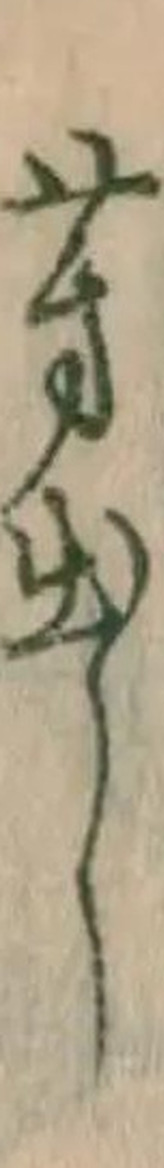芽出し
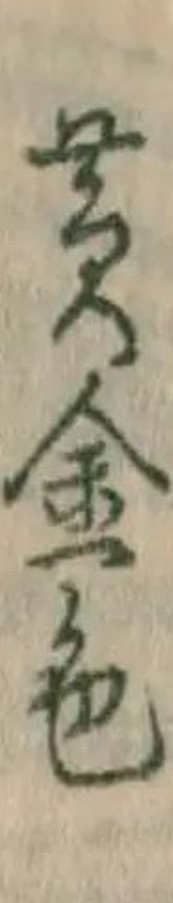黄金色
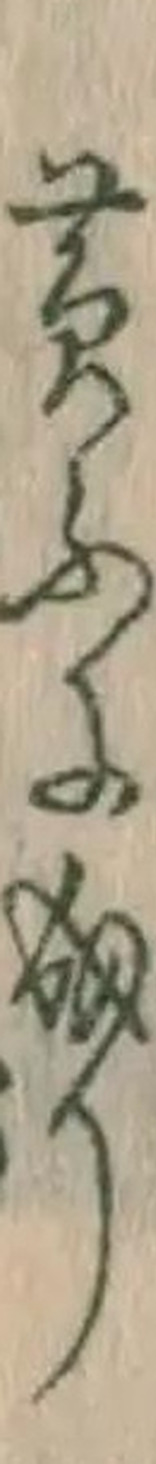黄ふに成り
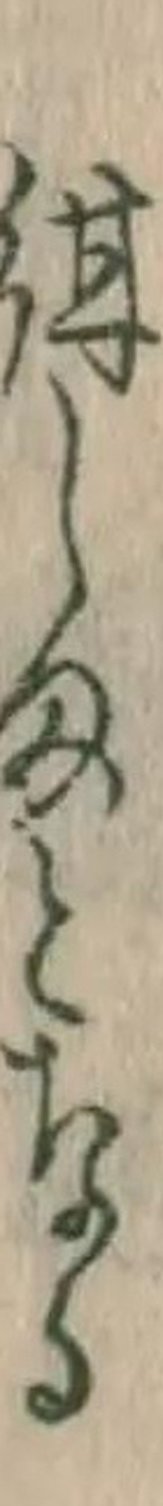紺しまとなる
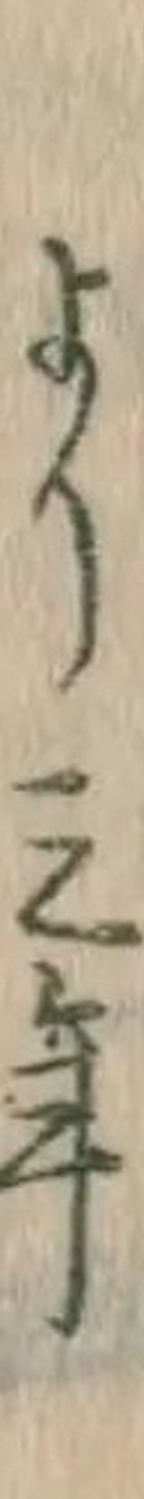より三年
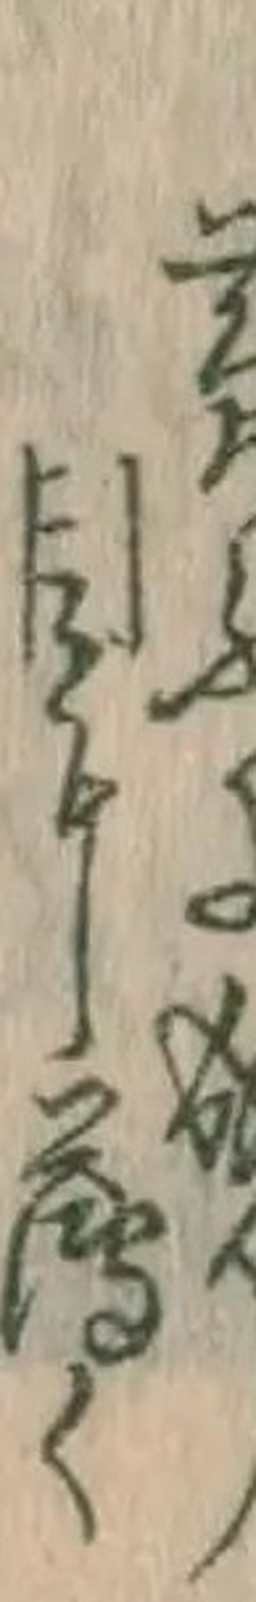目に薄く
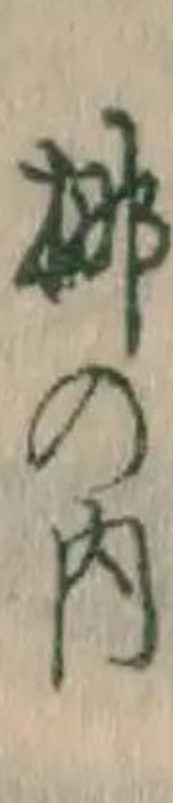梛の内
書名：草木奇品家雅見 3巻. [3]
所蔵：国立国会図書館 National Diet Library, JAPAN
